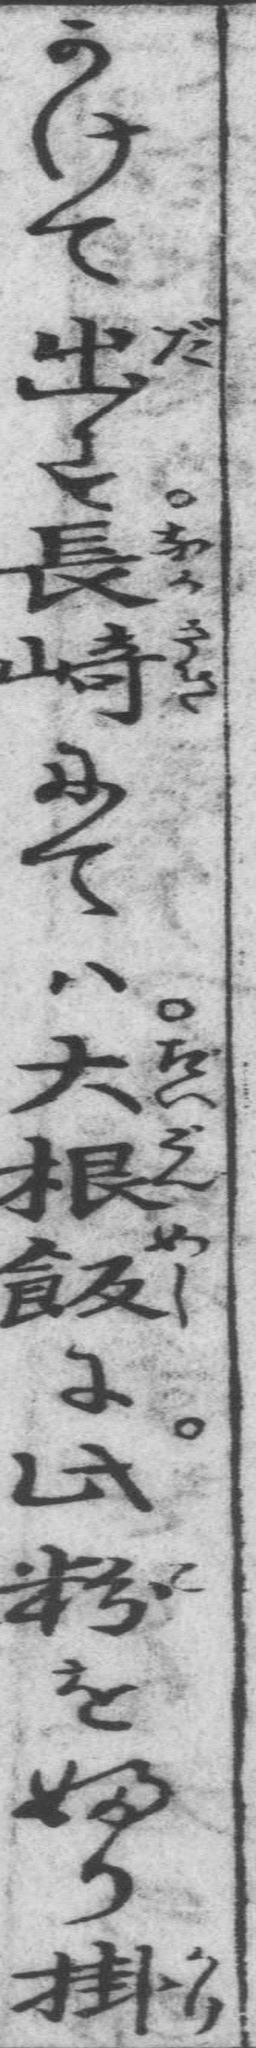かけて出す。長崎にては。大根飯に。此粉をふり掛
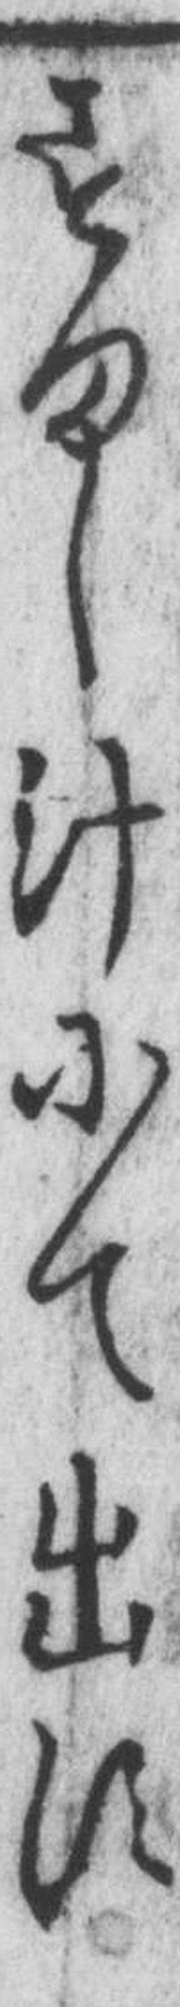すまし汁にて出す
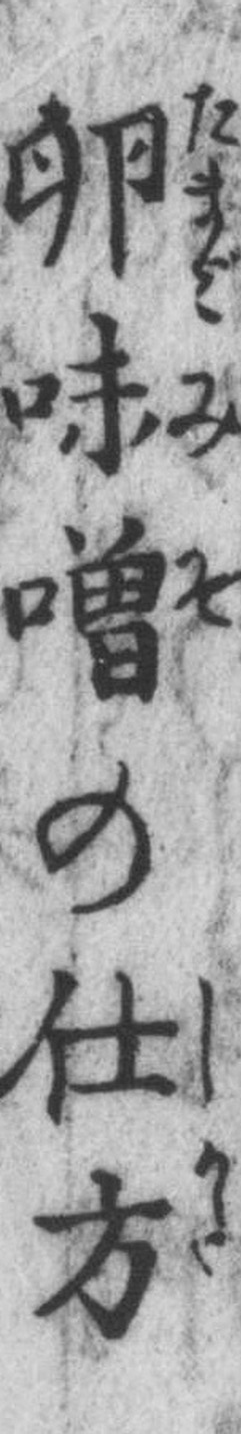卵味噌の仕方

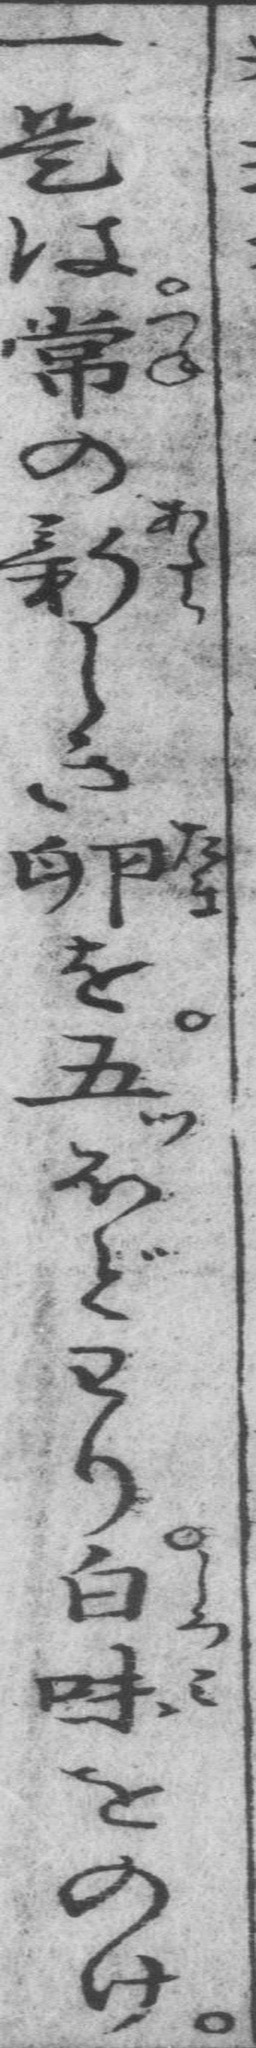一是は。常の新しき卵を。五ツほどわり。白味をのけ。
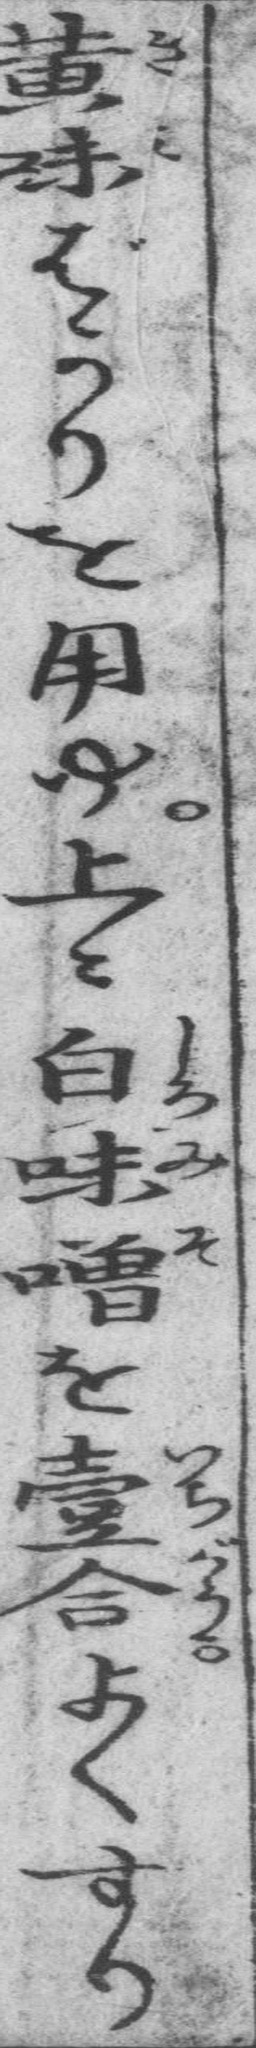黄味ばかりを用ゆ。上々白味噌を壱合。よくすり
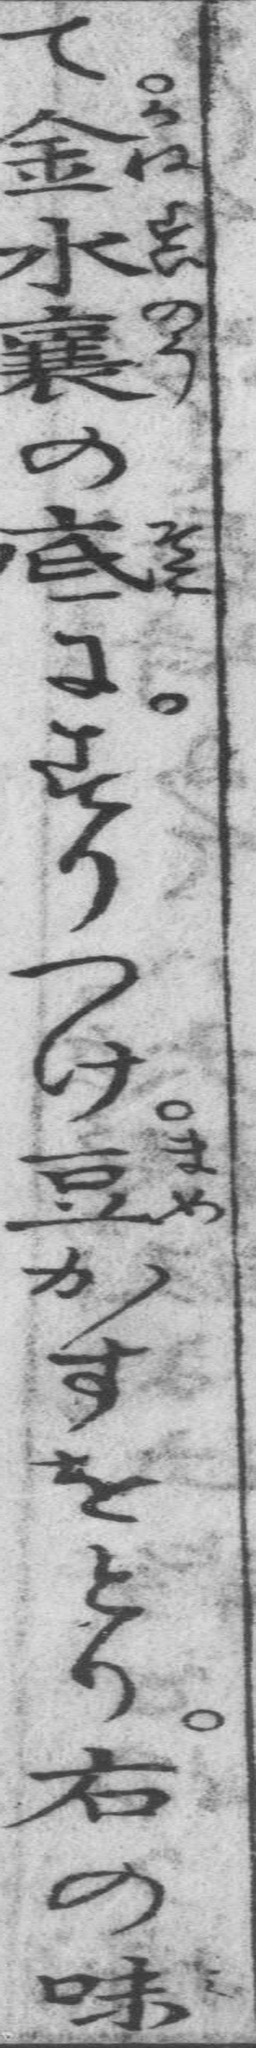て。金水嚢の底に。すりつけ。豆かすをとり。右の味
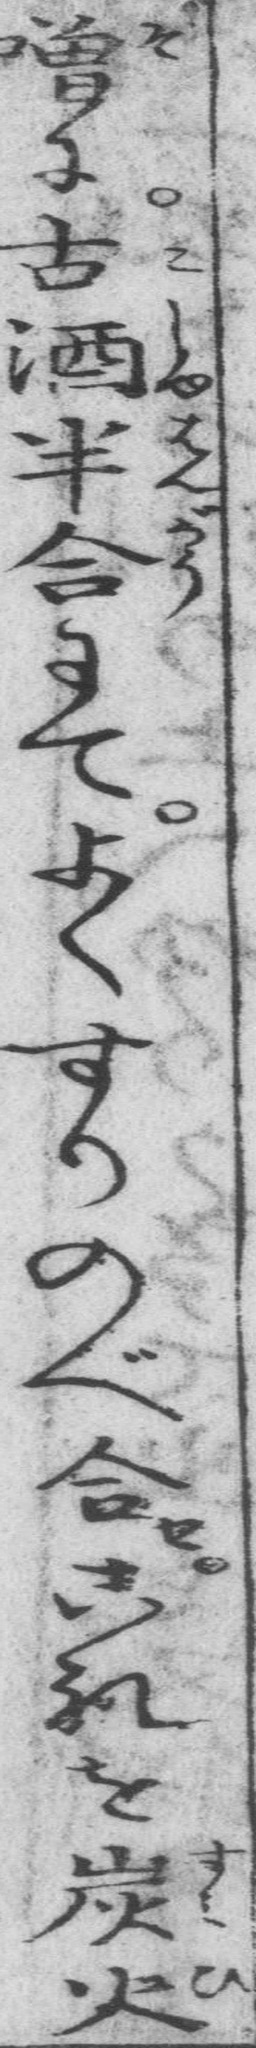噌に。古酒半合にて。よくすりのべ合せ。これを炭火
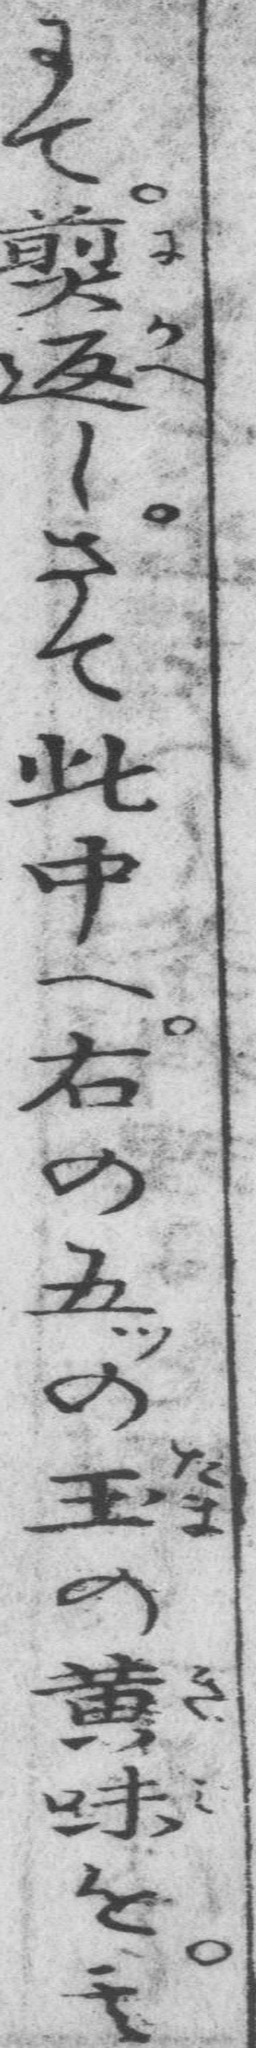にて。煎返し。さて此中へ。右の五ツの玉の黄味を。其
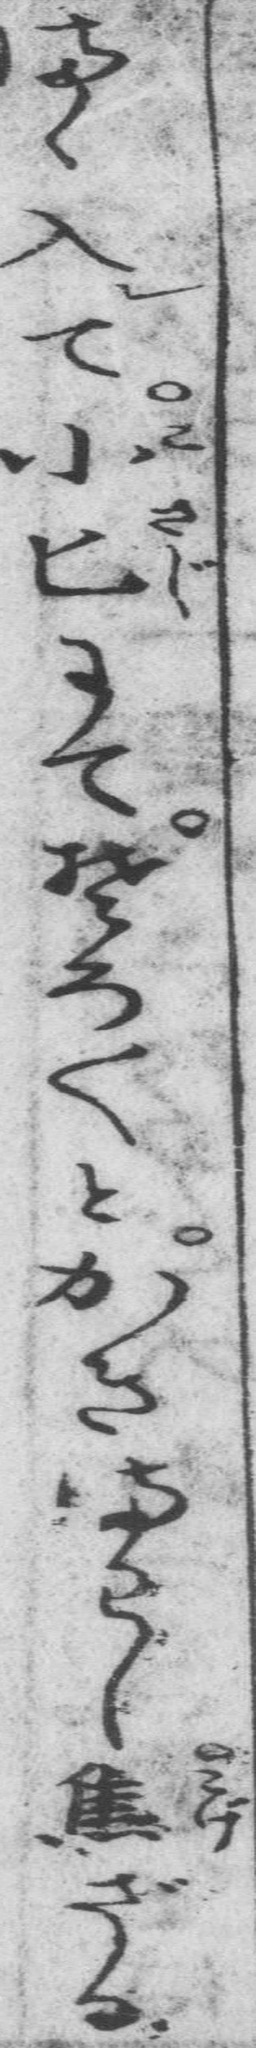まゝ入れて。小匕にて。そろ〳〵と。かきまわし。焦ざる
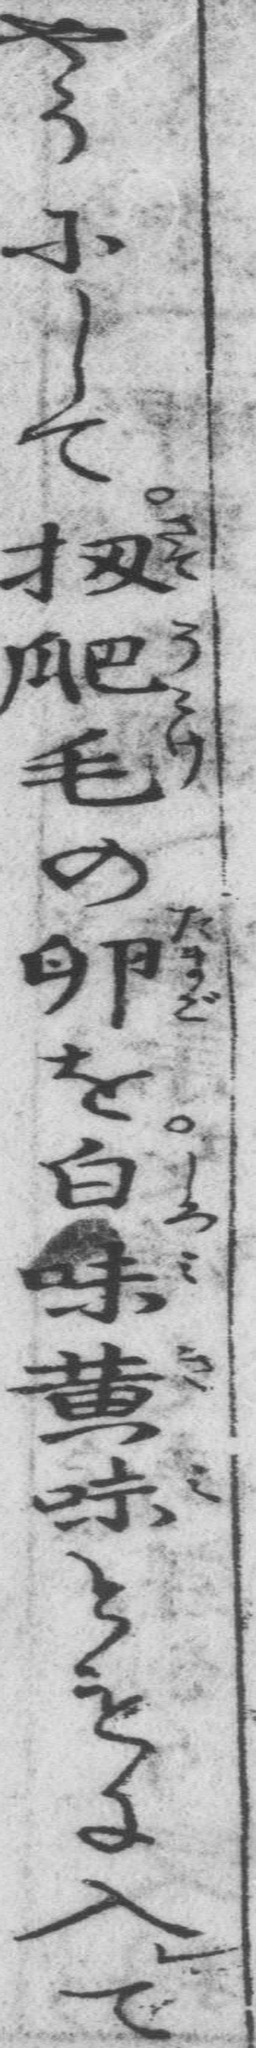やうにして。扨爬毛の卵を。白味黄味ともに入れて
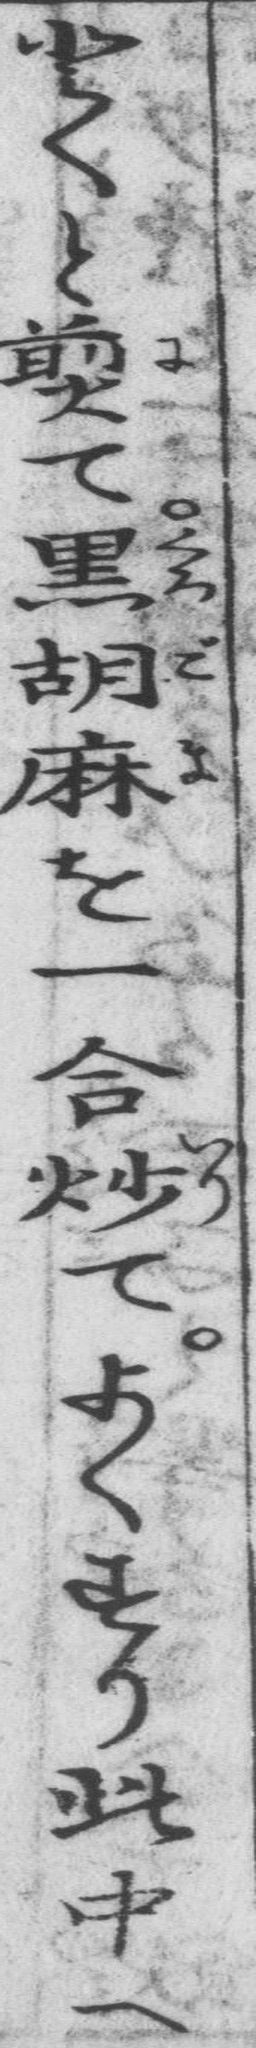とくと煎て。黒胡麻を一合炒て。よくすり此中へ
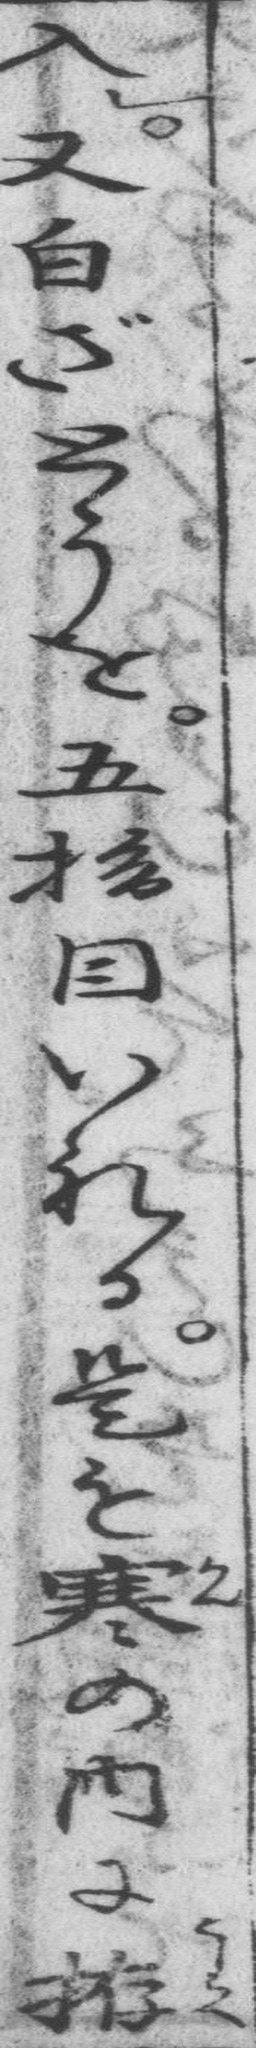入れ。又白ざとうを。五拾目いれる。是も寒の内に拵
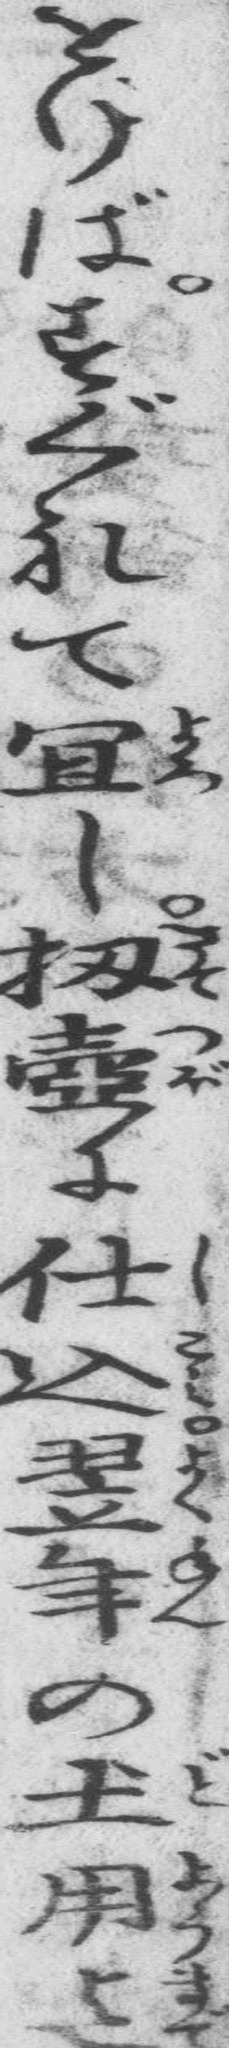をけば。すぐれて宜し。扨壺に仕込。翌年の土用迄
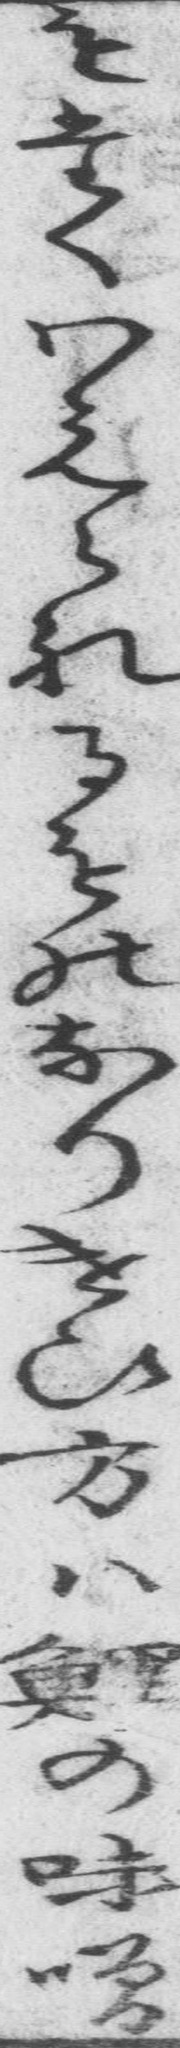も。たくわえられるものなり。遣ひ方は。鯉の味噌
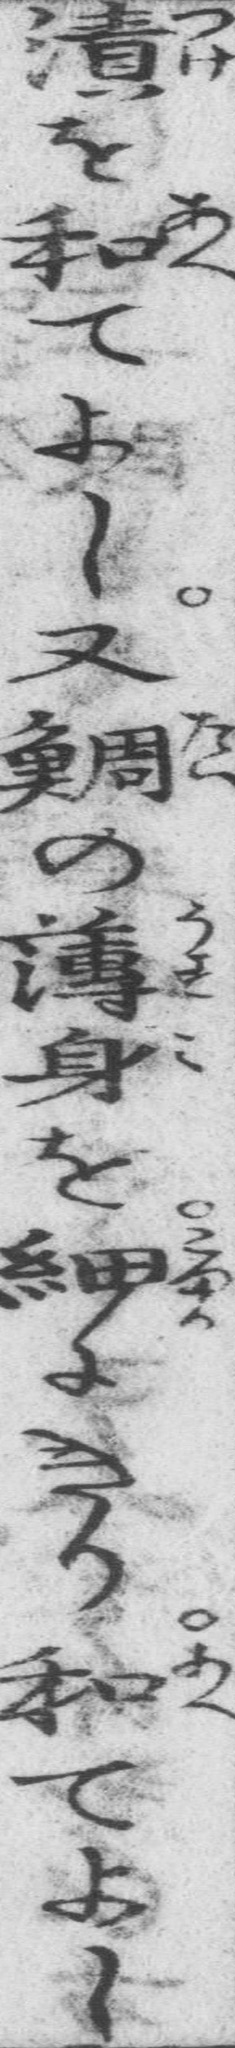漬を和てよし。又鯛の薄身を。細にきり。和てよし
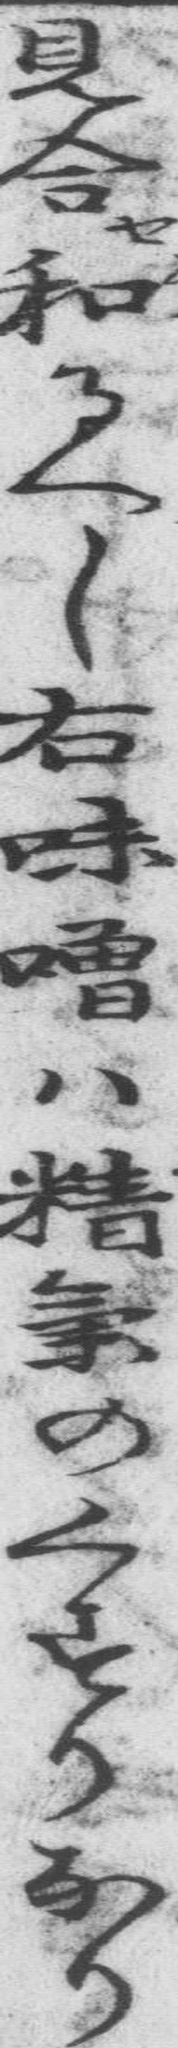見合せ和るへし。右味噌は。精気のくすりなり
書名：萬寳料理秘密箱
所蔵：大阪府立大学学術情報センター 国文学研究資料館
